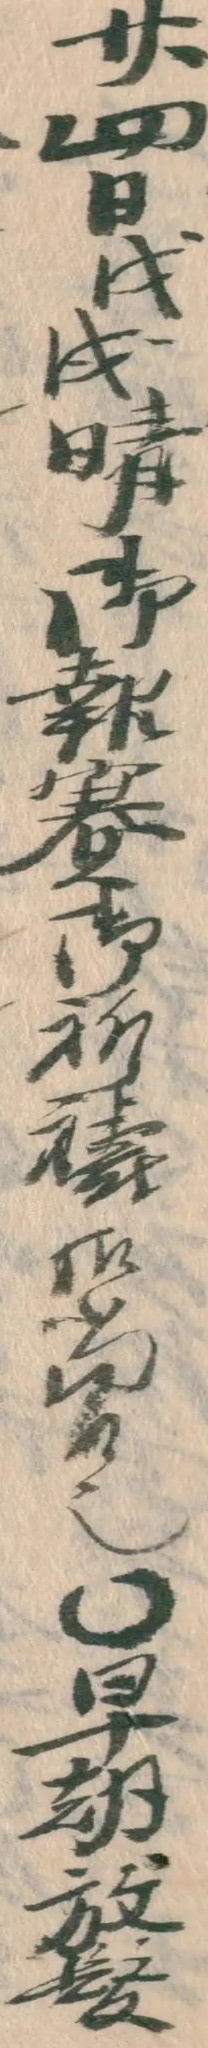廿四日戊戌晴御報賽御祈祷御當日也○早朝放髪
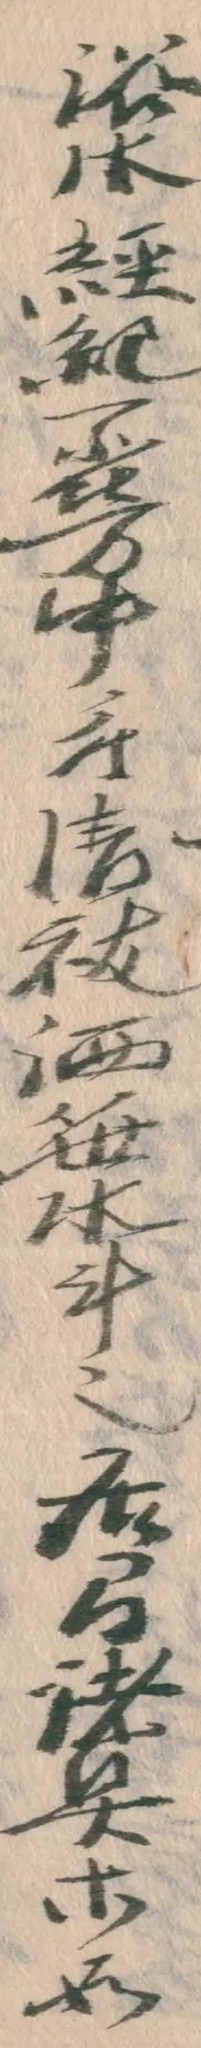浴水経紀所労中ニ付清祓洒笹水斗也居間諸具等如
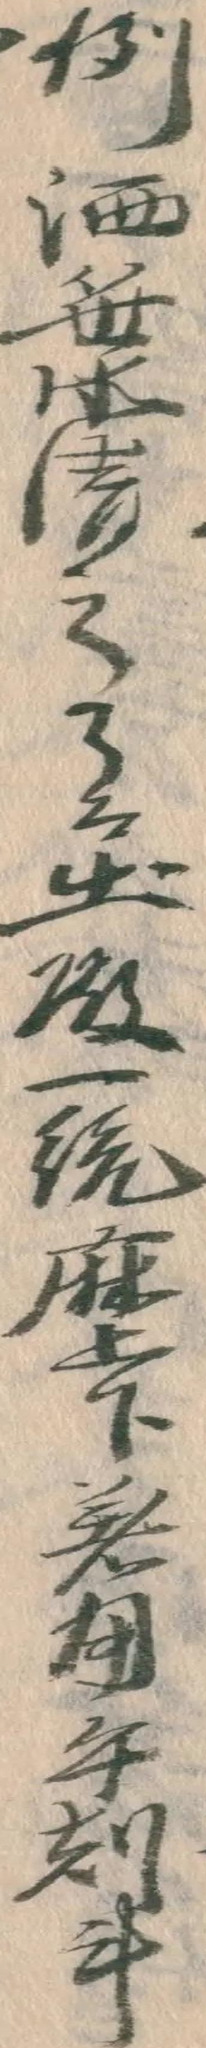例酒笹木清之了而出殿一統麻上下着用午刻斗
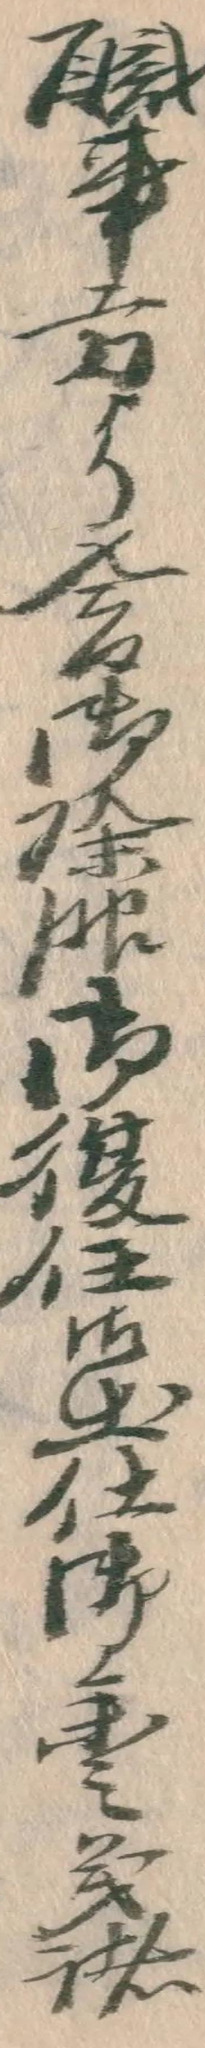職事方より今日御除服御復任御出仕御参之義諸
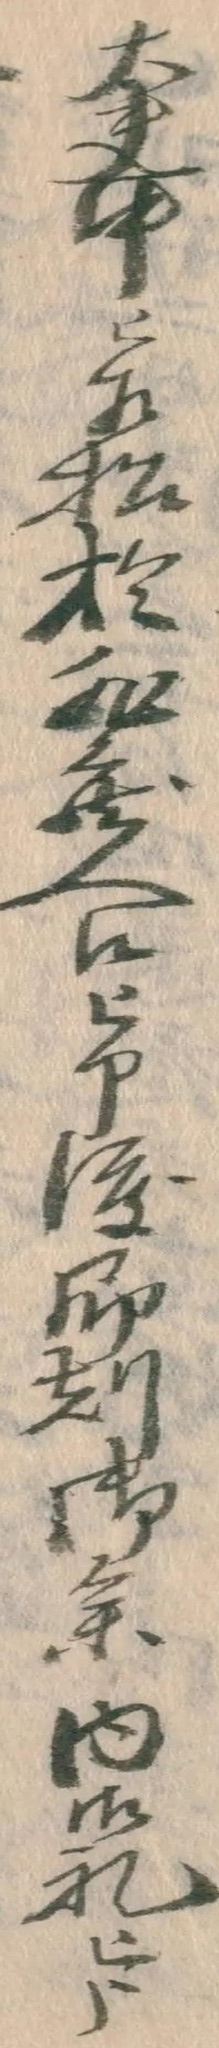大夫中被相招於非蔵人え被申渡即刻御参内御礼被申
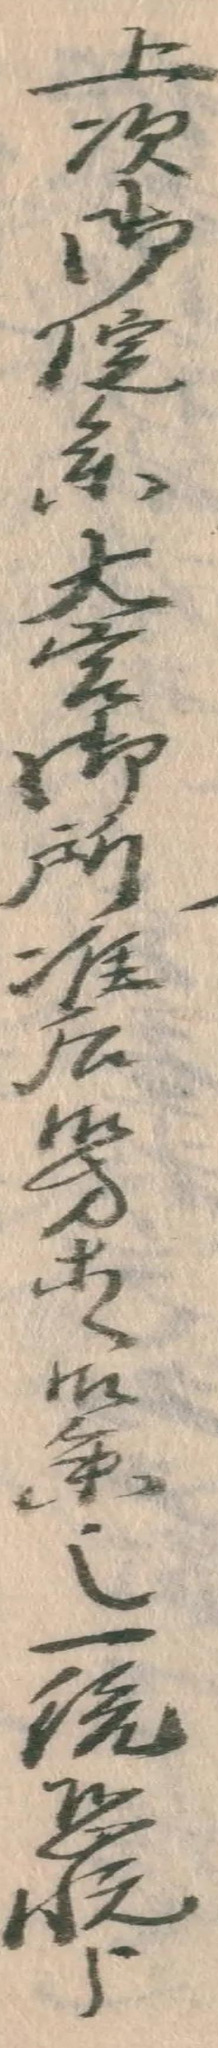上次御院参大宮御所准后御方等へ御参也一統恐悦申
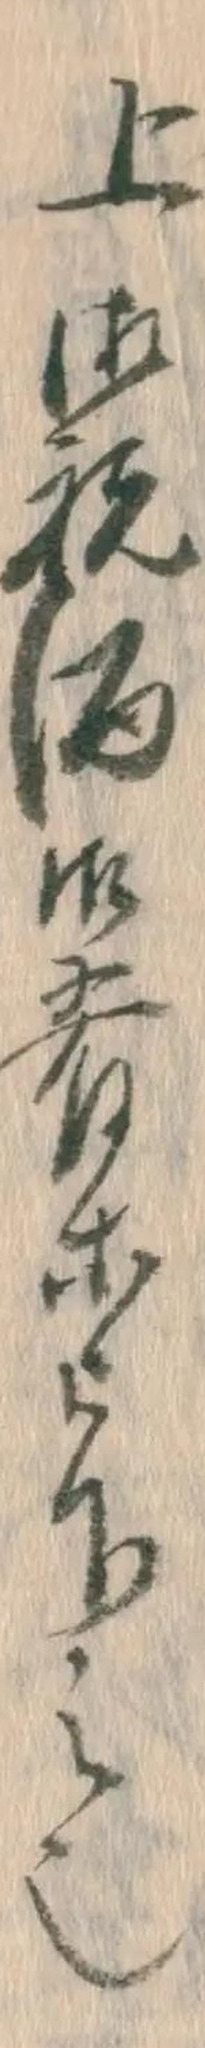上御祝酒御肴等被下之也
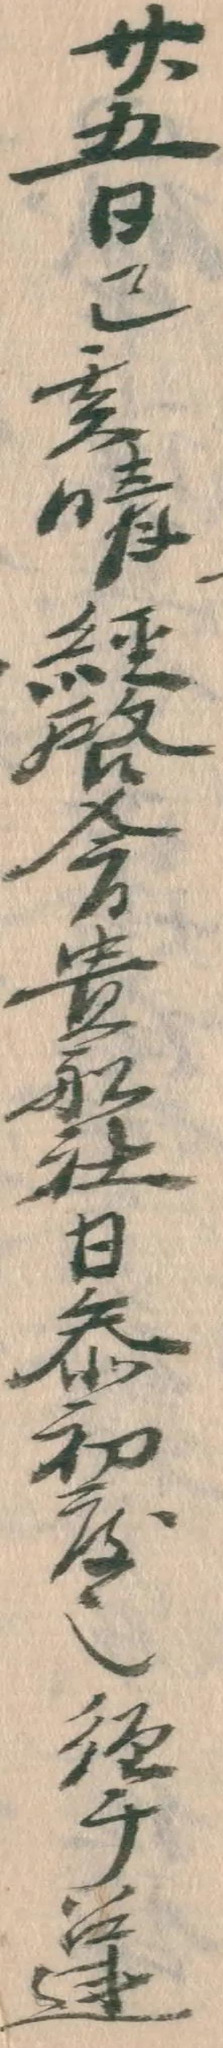廿五日乙亥時経啓今日貴舩社日参初度也経千召連
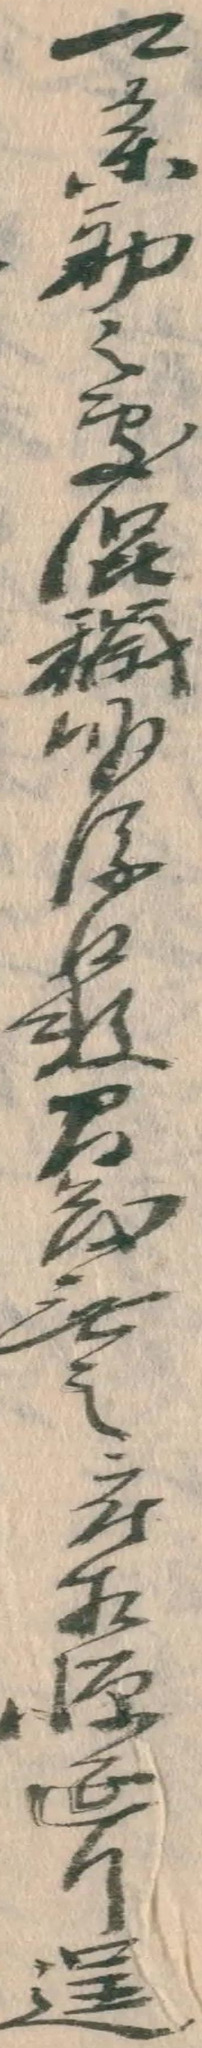可参勤之處混穢明後日数間義無之ニ付相憚延引逞
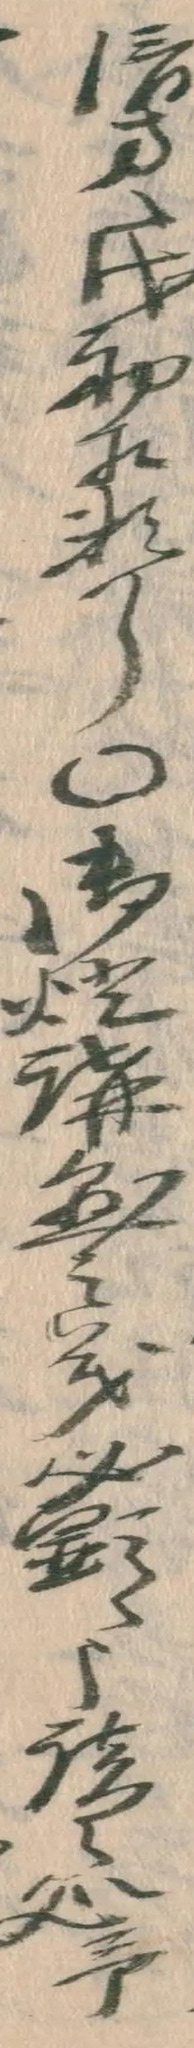清方へ代勤相頼了〇御燈講懸之義必顕申談候処予
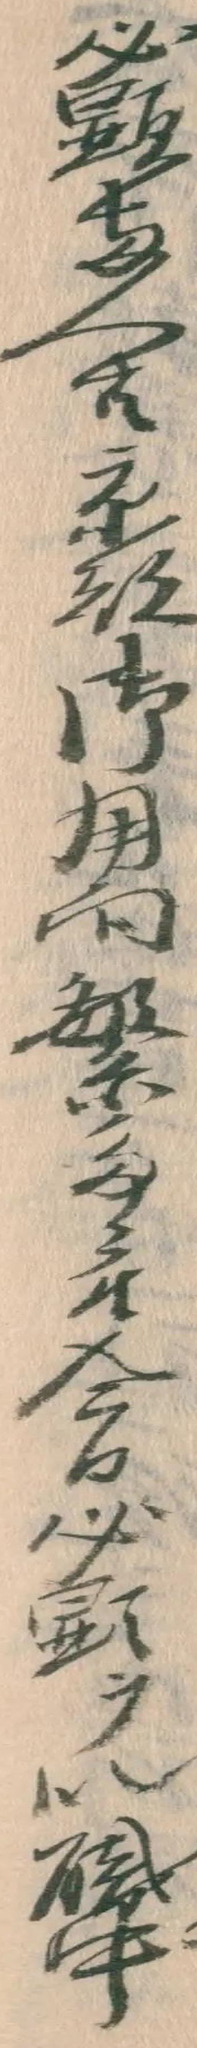必顕両人共京都御用向繁多ニ付今日必頸を以職中
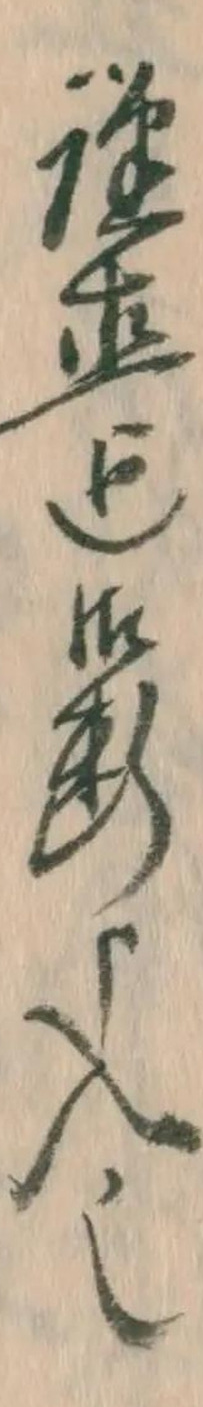謹直迄御断申入也
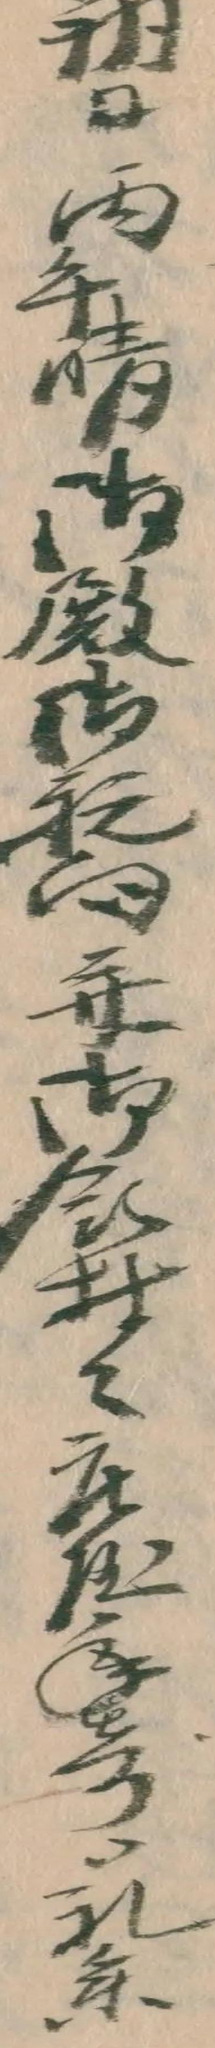朔日丙午晴御殿御祝向幷御領村々庄屋年寄御礼参
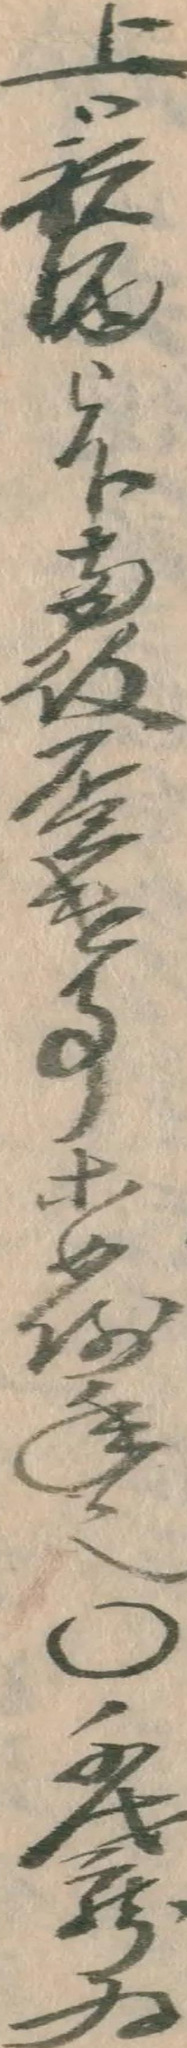上御祝酒被下両役盃遣事等如例年也○千代蔵為
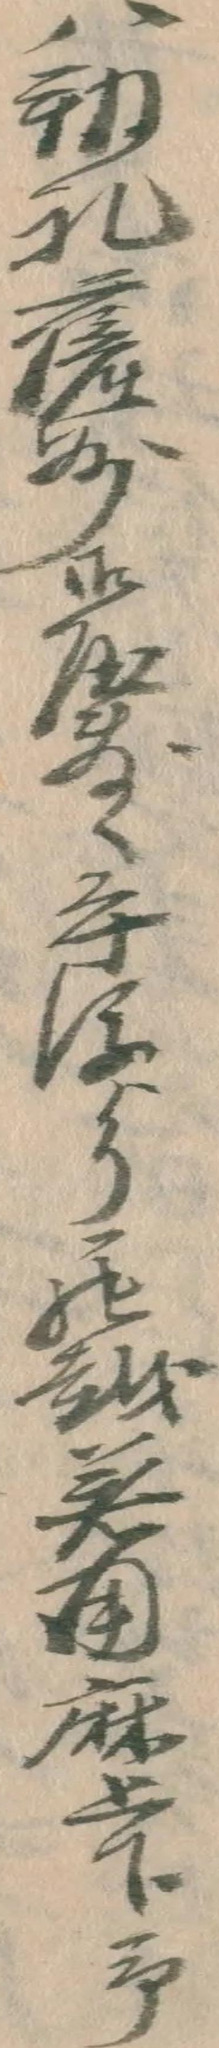八朔礼薩州御屋敷へ午後より罷越着用麻上下予
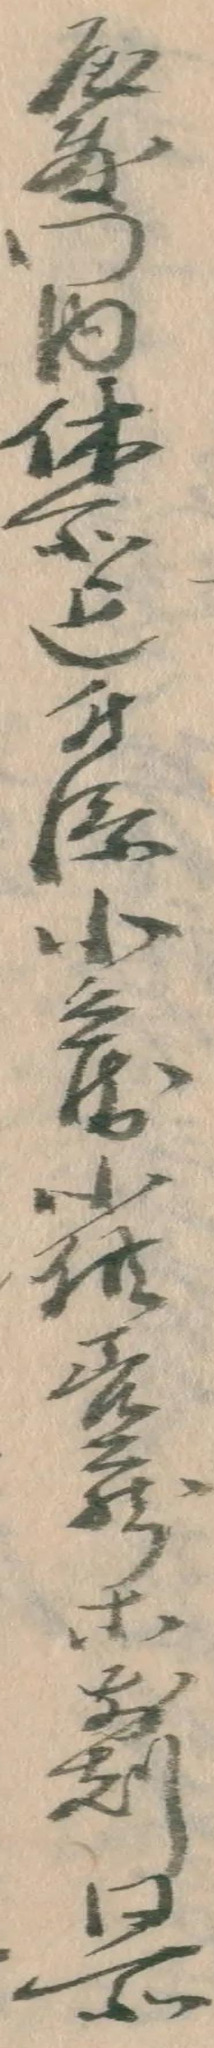屋敷門内休所迄付添小兵衛小供善蔵等前刻同所
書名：賀茂社記録. 第67冊
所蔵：国立国会図書館 National Diet Library, JAPAN
